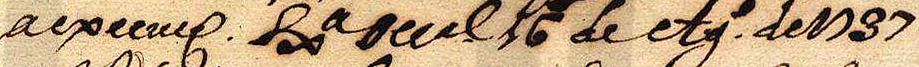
a execucā. Lxa occal 16 de Ag.o de 1737.
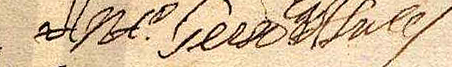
Ant.o Texra ALues
